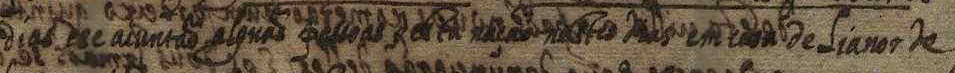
dias e se aiuntaõ alguās pessoas desta naçaõ nestes dias em casa de Lianor de
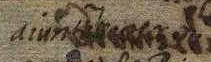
aiuntāse os xn
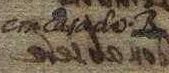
em casa da R
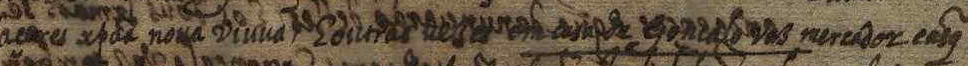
Caceres xpaā noua viuua E outras uezes em casa de Gonçalo vaz mercador e as q̄
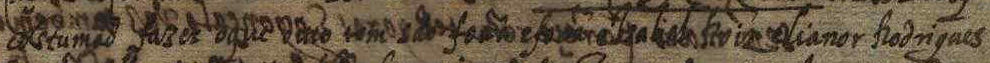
costumaõ fazer o que ditto tem são foaõ e foaõm e Izabel Roīz e lianor Rodrigues
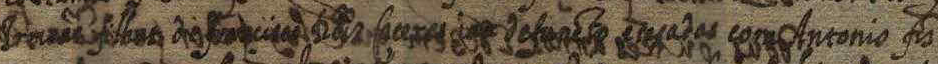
Irmaās filhas de francisco Roiz̄ de Caceres Iaa defuncto casadas com Antonio frz̄
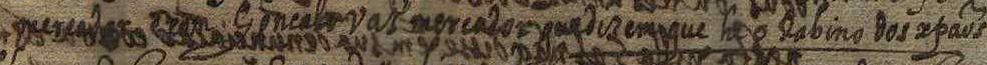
mercador e com Gomçalo Vaz mercador que dizem que he o Rabino dos xpaõs
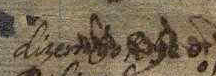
dizem q̄ o R he o
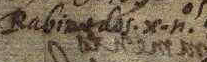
Rabino dos .x. n.os
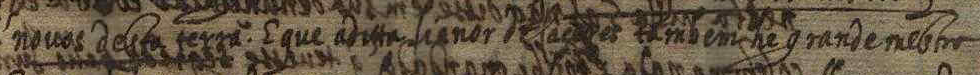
nouos desta terra. E que a dita lianor de Caceres tambem he grande mestra
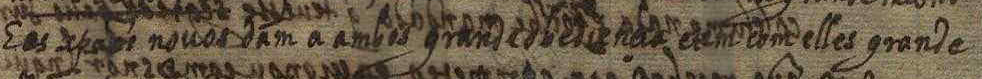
E os xpaõs nouos dam a ambos grande obediencia e tem com elles grande
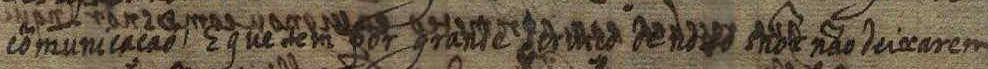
cōmunicação / E que tem por grande seruiço de nosso snōr não deixarem
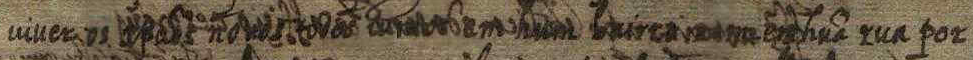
uiuer os xpaõs novos todos iuntos em hum bairro nem em huā rua por
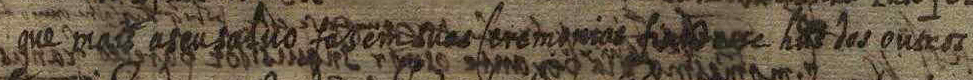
que mais a seu saluo fazem suas Ceremonias fiandosse hūs dos outros
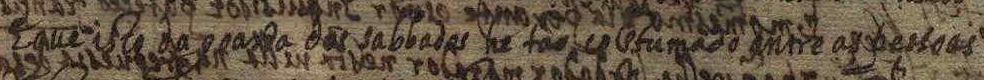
E que isto da goarda dos sabbados he tão costumado antre as pessoas
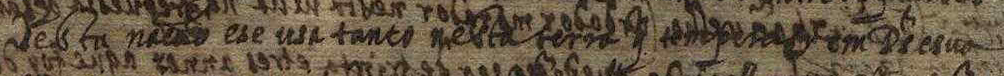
desta nação e se usa tanto nesta terra q̄ tem pera sy em Ds̄ e sua
